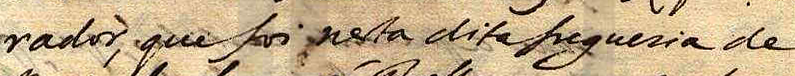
rador, que foi nesta dita freguezia de
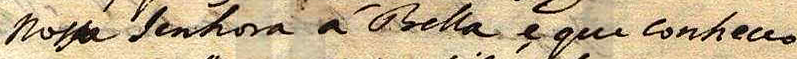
nossa Senhora a Bella e que conheceo
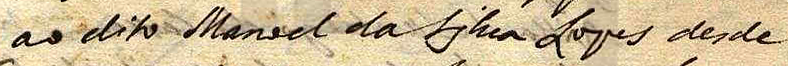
ao dito Manoel da Sjlua Lopes desde
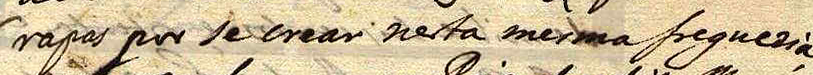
rapas por se crear nesta mesma freguezia,
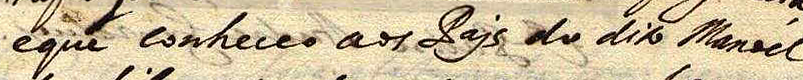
e que conheceo aos Pajs do dito Manoel
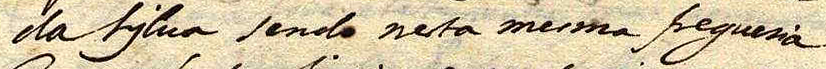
da Sylua sendo nesta mesma freguezia
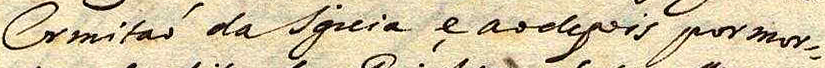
Ermitaõ da Igreia, e ao depois por mor
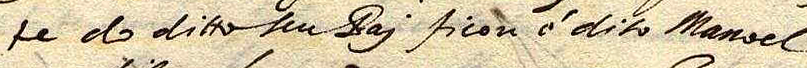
te do ditto seu Paj ficou o dito Manoel
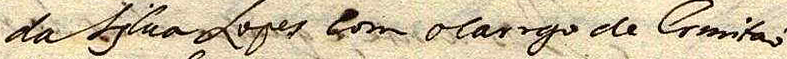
da Sjlua Lopes com o cargo de Ermitaõ
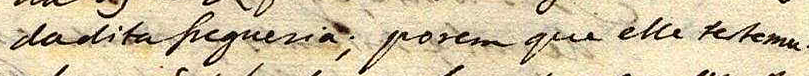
da dita freguezia; porem que elle testemu
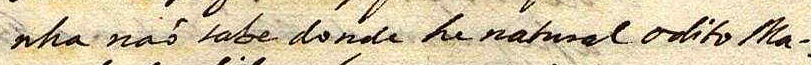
nha naõ sabe donde he natural o dito Ma
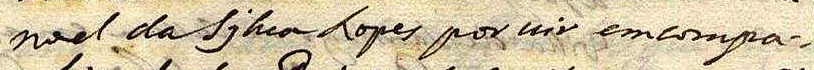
noel da Sjlua Lopes por uir em compa
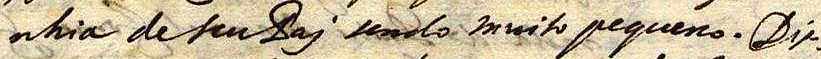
nhia de seu Paj sendo muito pequeno. Dis
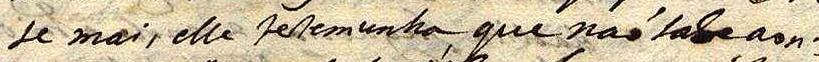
se mais elle testemunha, que naõ sabe aon
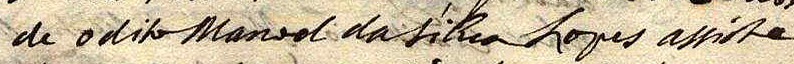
de o dito Manoel da Silua Lopes assiste
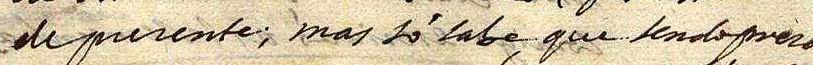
de prezente; mas só sabe, que sendo prezo
